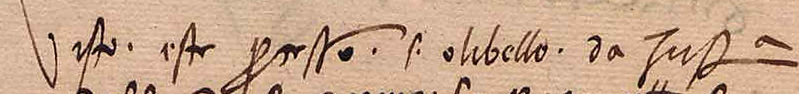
Visto este ꝓcesso. s. o libello da Justa
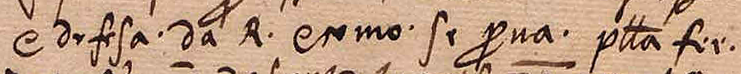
e defesa. da R. e como. se ꝓua. pl̄la fee.
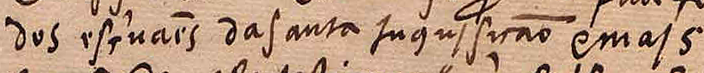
dos esciuaẽs da santa Jnqujsição e majs
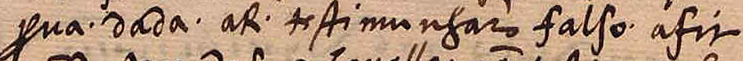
ꝓua. dada. a R. testimunhar falso afir
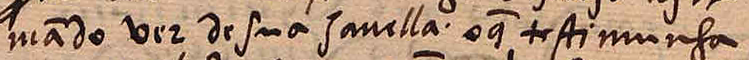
mādo ver de sua Janella. o q̄ testimunha
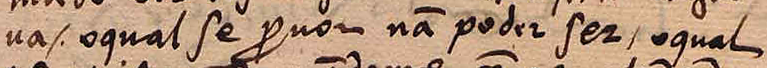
ua /. o qual se ꝓuou nā poder ser / o qual
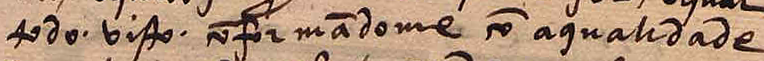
todo. visto. cōformādome c̄o a qualidade
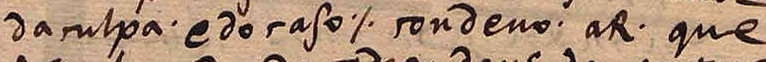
da culpa. e do caso ./. condeno. a R. que
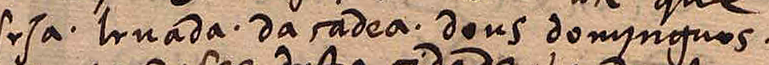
seJa. leuada. da cadea. dous domjnguos
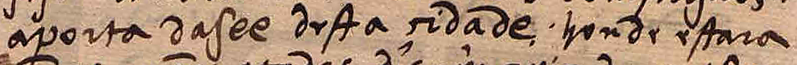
a porta da see desta cidade honde estara
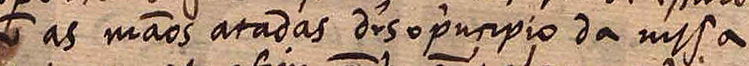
cō as mãos atadas des o p̄ncipio da mjsa
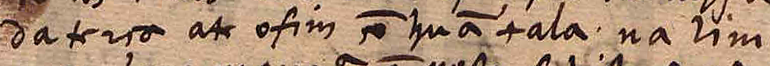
da terça ate o fim c̄o huā tala na lim
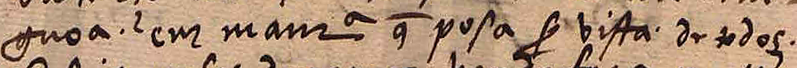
guoa. em manra q̄ posa ꞩ vista. de todos.
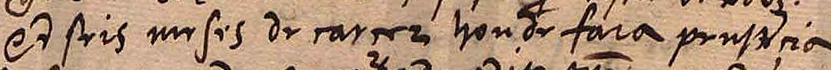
e ē seis meses de carcer honde fara penjtēcia
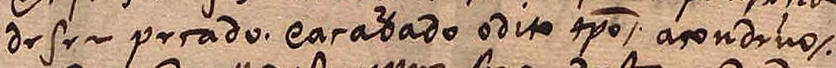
de seu pecado. e acabado o dito tp̄o /. a condeno /.
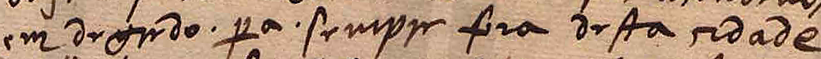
em degredo. ꝑa. sempre fora desta cidade
